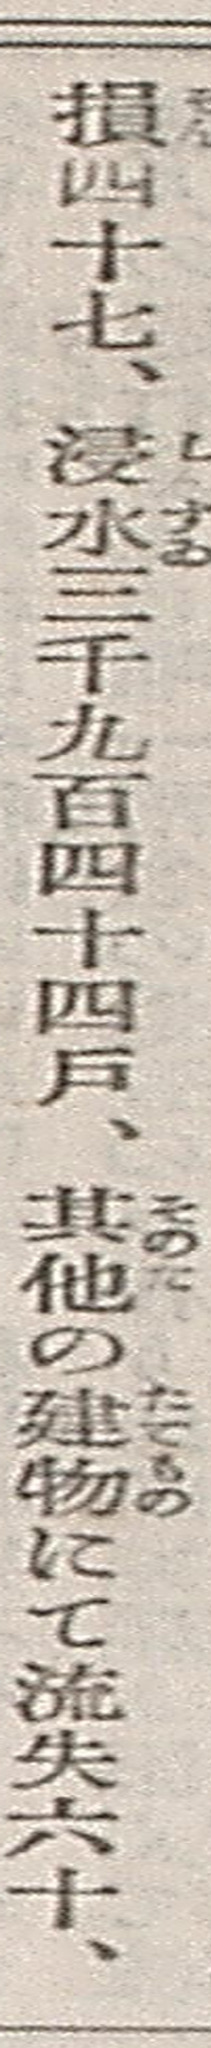損四十七、浸水三千九百四十四戸、其他の建物にて流失六十、
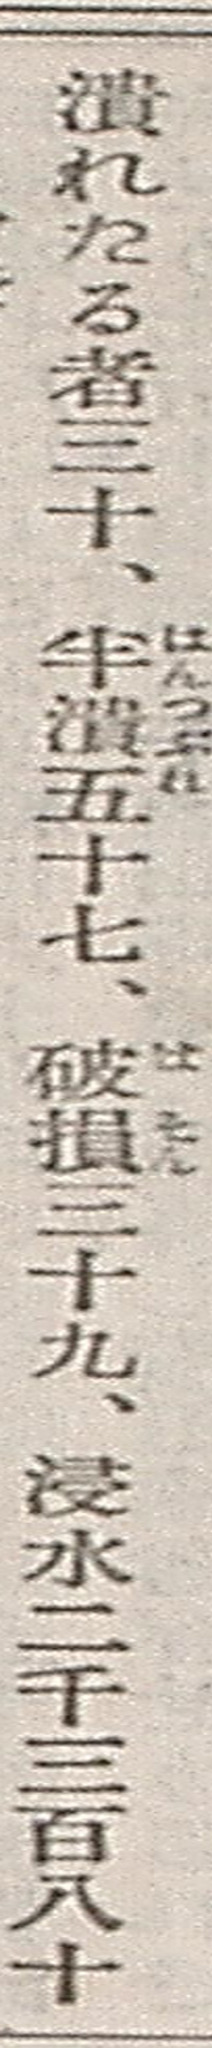潰れたる者三十、半潰五十七、破損三十九、浸水二千三百八十
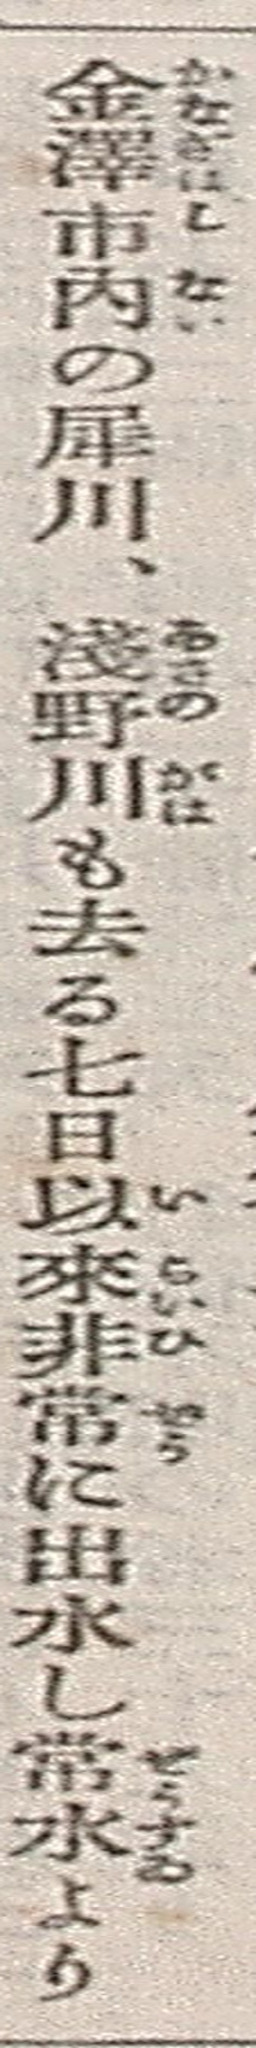金沢市内の犀川、浅野川も去る七日以来非常に出水し常水より
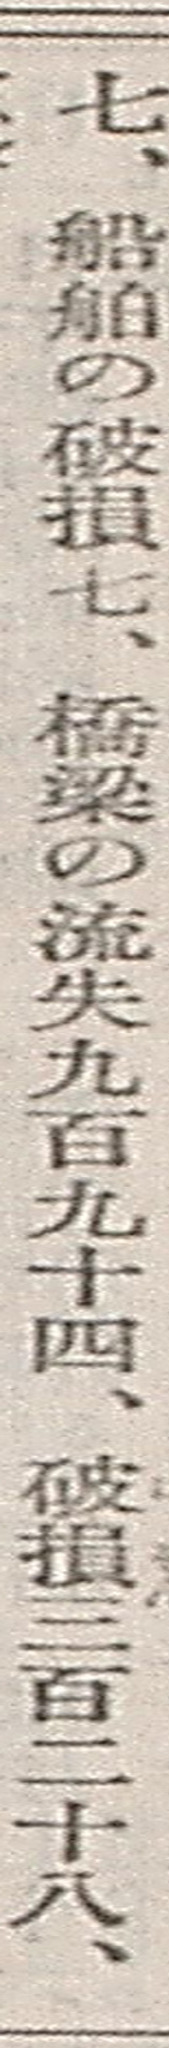七、船舶の破損七、橋梁の流失九百九十四、破損三百二十八、
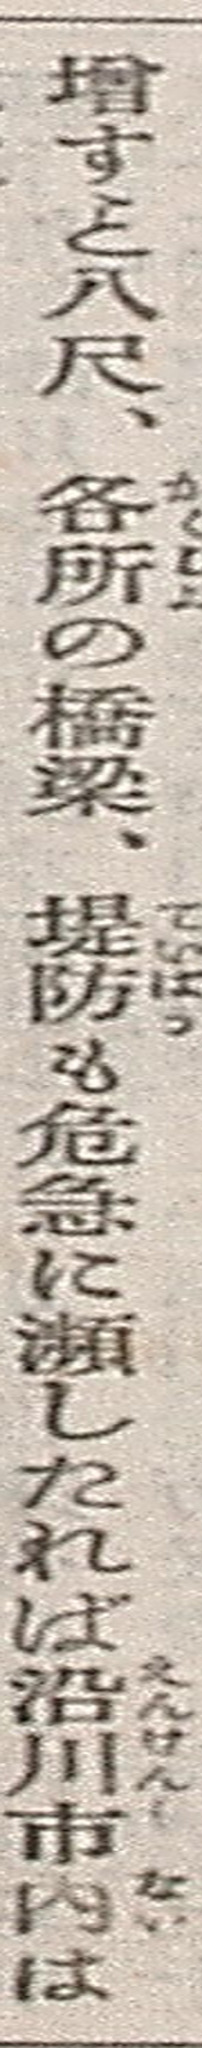増すこと八尺、各所の橋梁、堤防も危急に瀕したれば沿川市内は
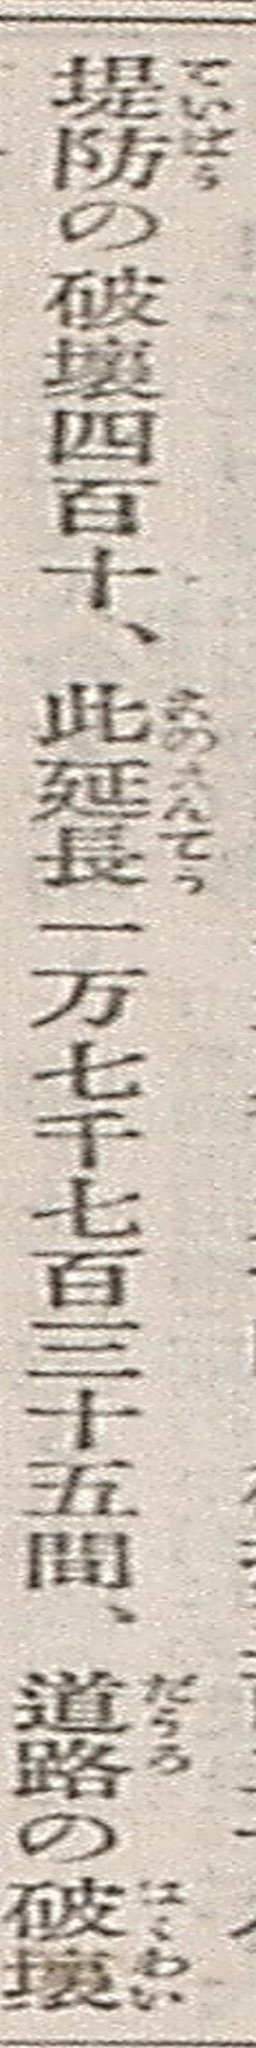堤防の破壊四百十、此延長一万七千七百三十五間、道路の破壊
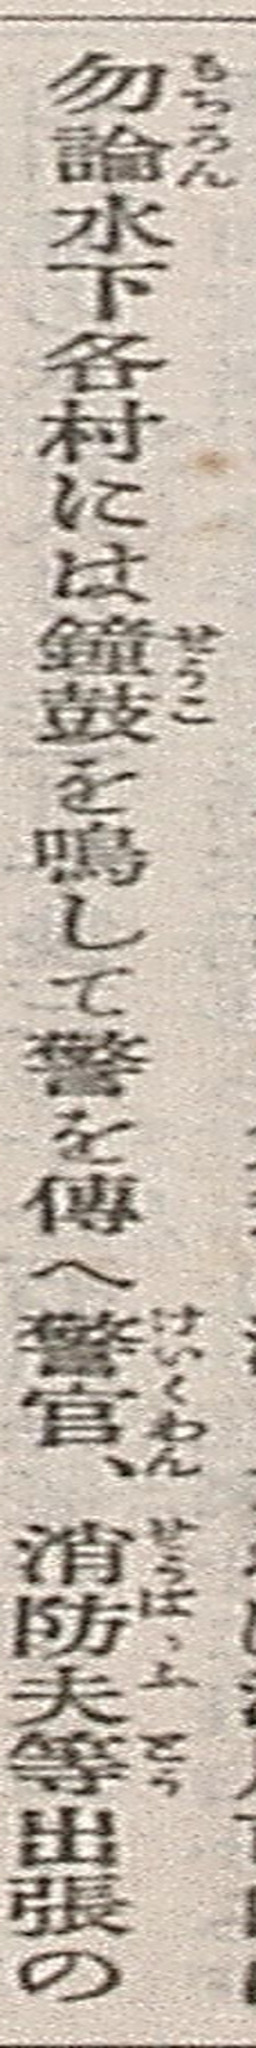勿論水下各村には鐘鼓を鳴して警を伝へ警官、消防夫等出張の
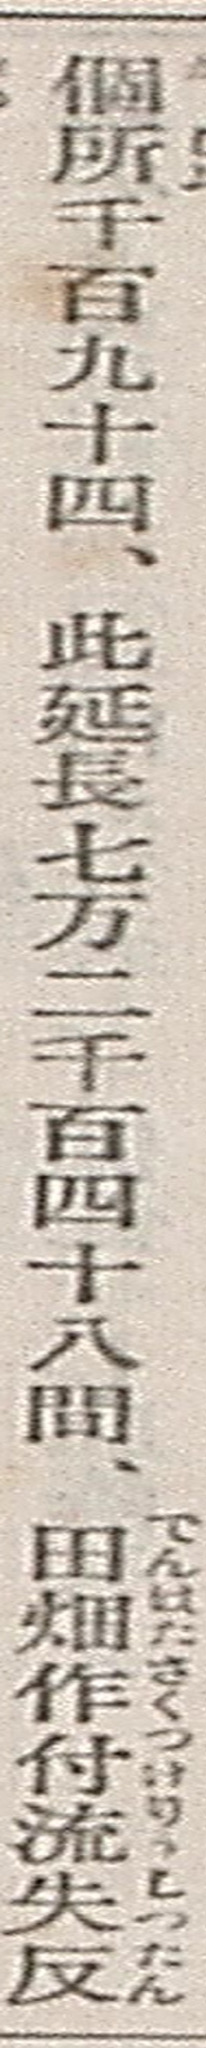個所千百九十四、此延長七万二千百四十八間、田畑作付流失反
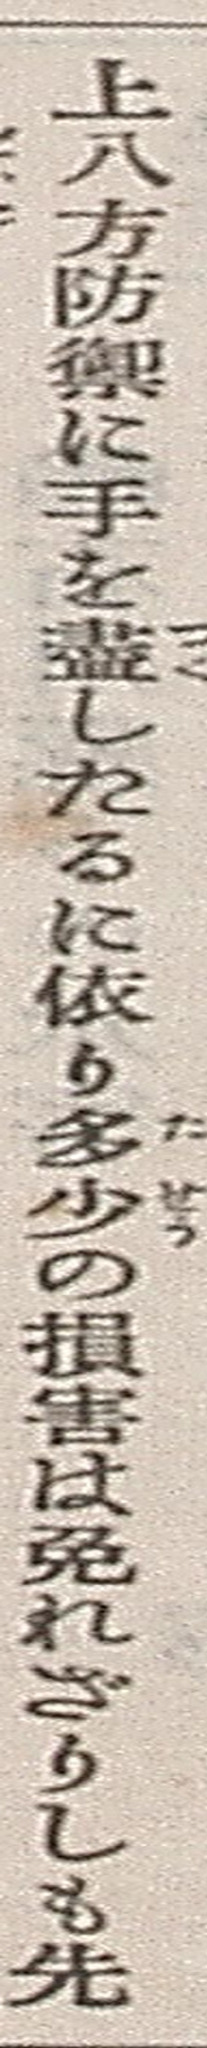上八方防禦に手を盡したるに依り多少の損害は免れざりしも先
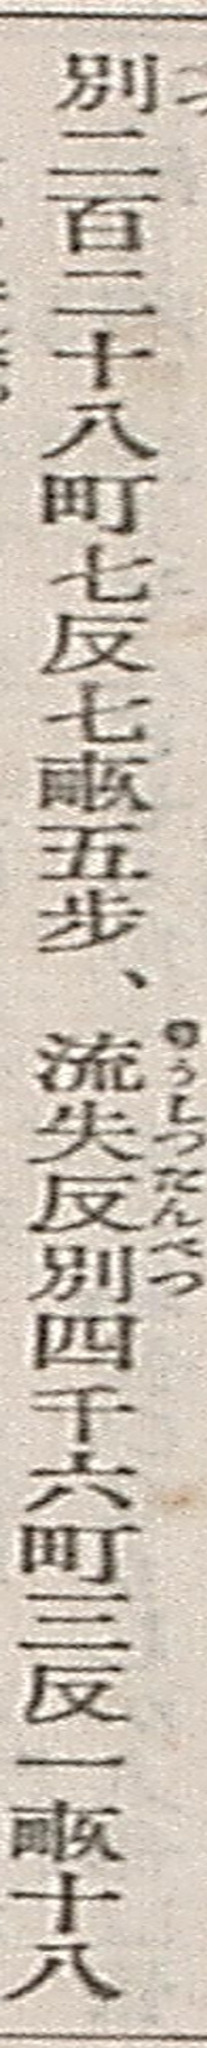別二百二十八町七反七畝五歩、流失反別四千六町三反一畝十八
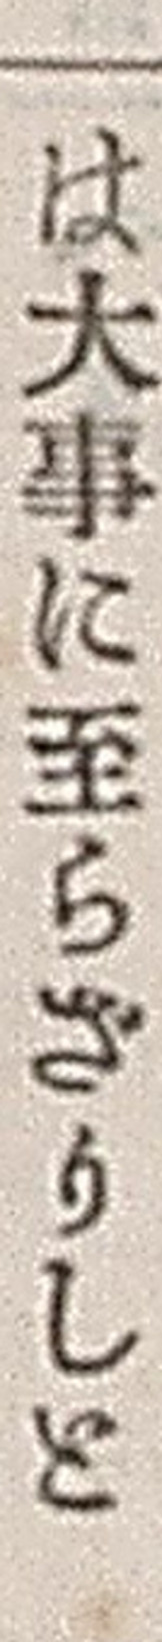は大事に至らざりしと
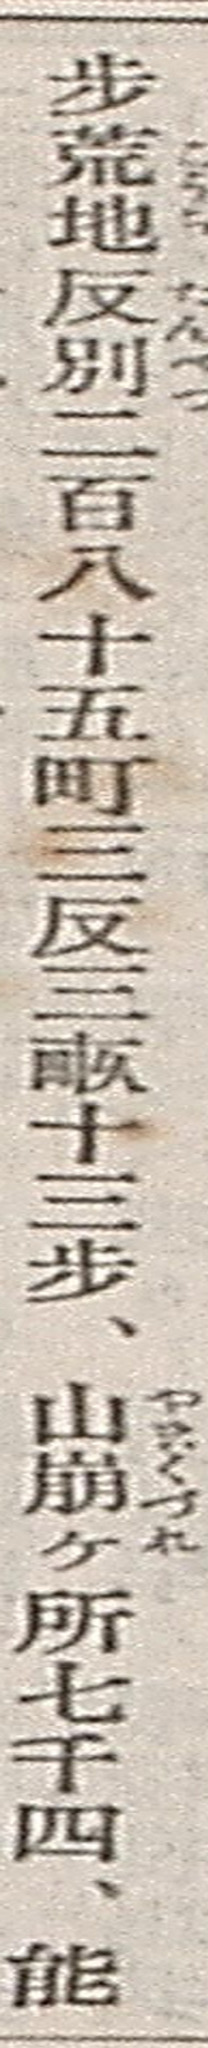歩荒地反別二百八十五町三反三畝十三歩、山崩ヶ所七千四、能
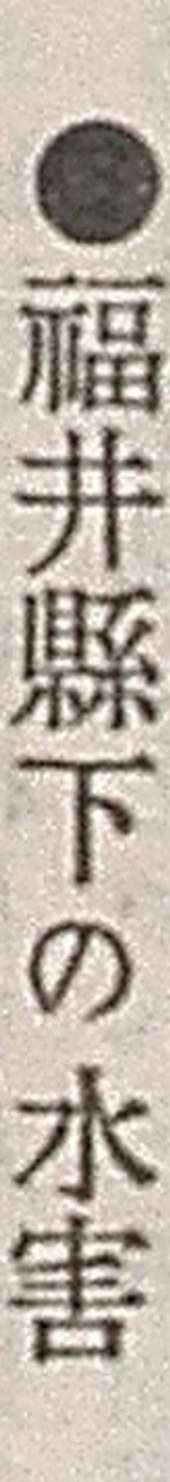●福井県下の水害
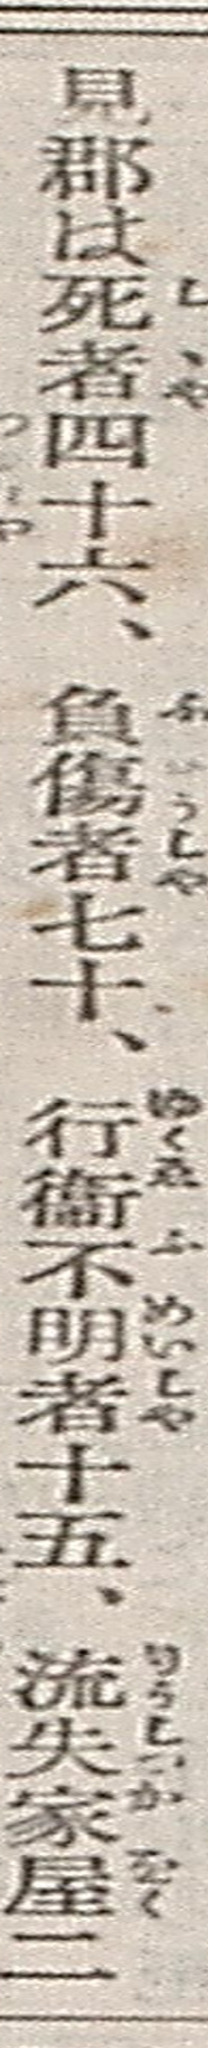見郡は死者四十六、負傷者七十、行衛不明者十五、流失家屋二
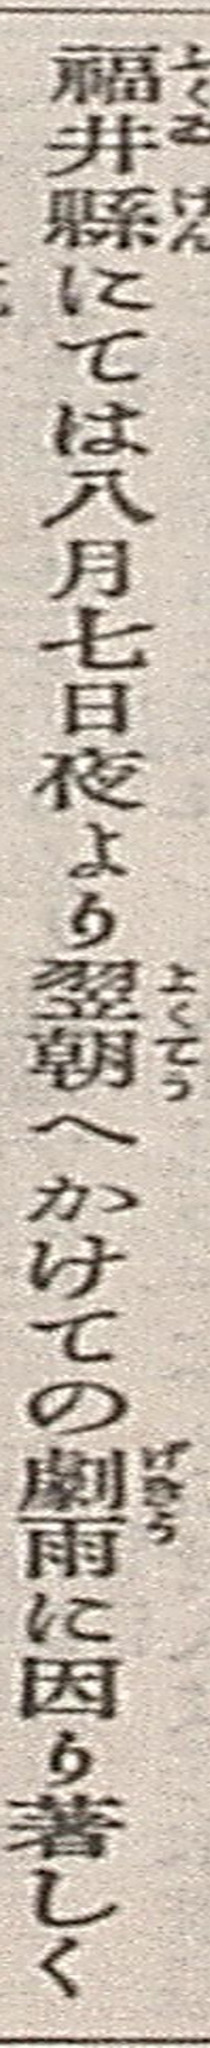福井県にては八月七日夜より翌朝へかけての劇雨に因り著しく
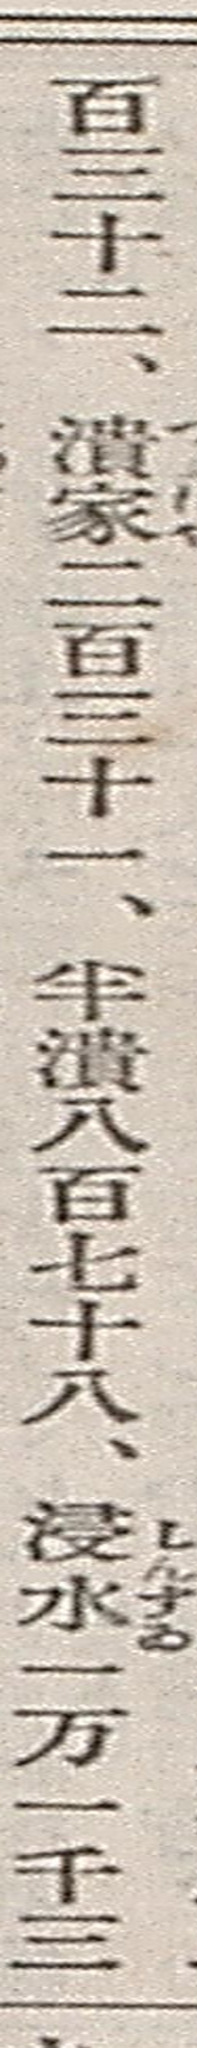百三十二、潰家二百三十一、半潰八百七十八、浸水一万一千三
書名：風俗畫報臨時増刊第百二十八號　洪水被害録（下）
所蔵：東京大学地震研究所図書室 Earthquake Research Institute Library, The University of Tokyo, JAPAN
